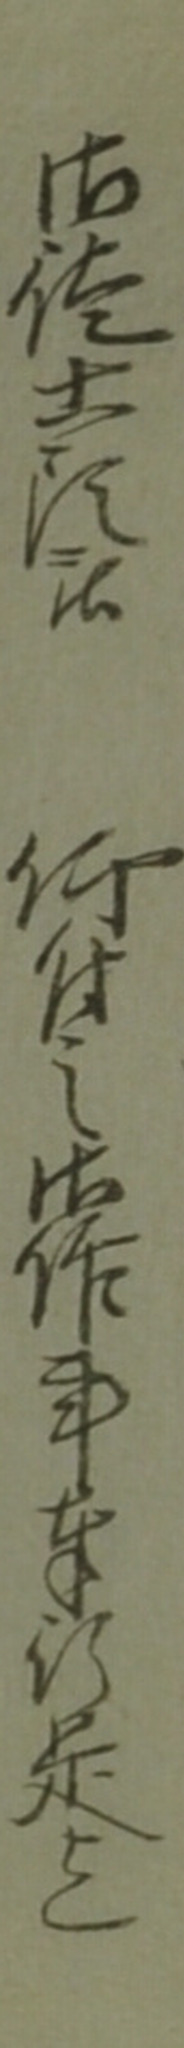御徒士頭被仰付之御作事奉行是迄
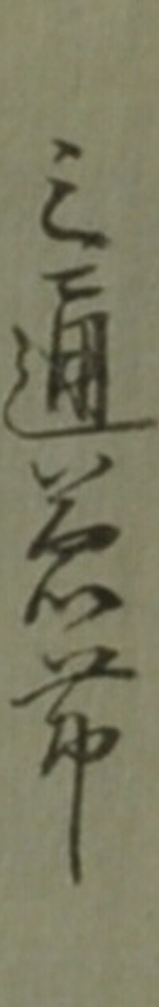之通兼帯
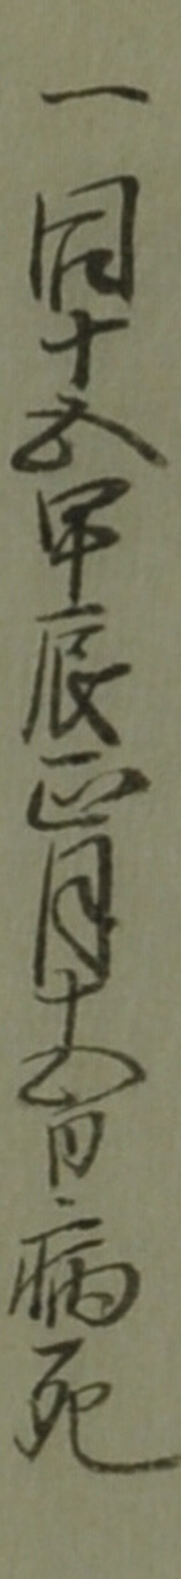一同十五甲辰正月十五日病死
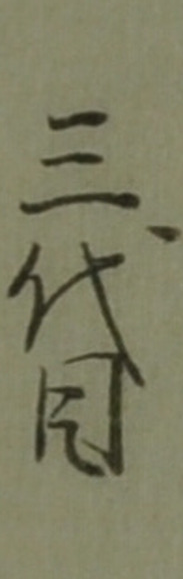三代目
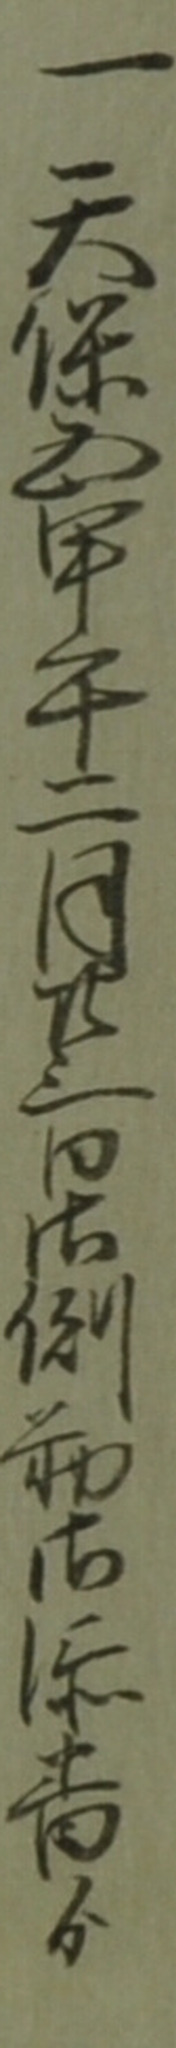一天保五甲午二月廿三日御側勤御添番ゟ
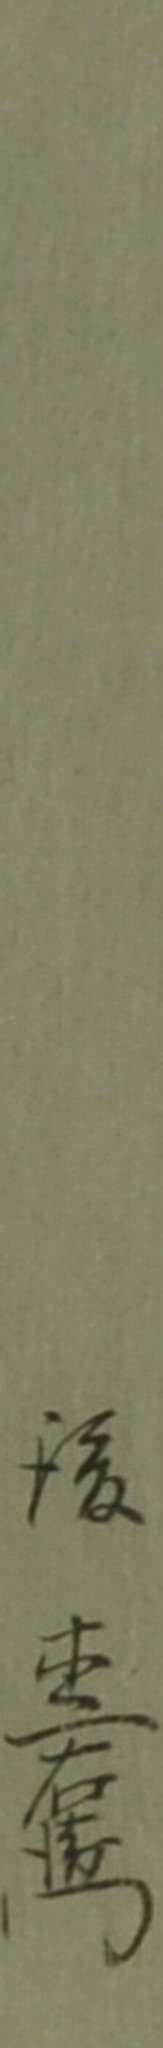後杢右衛門
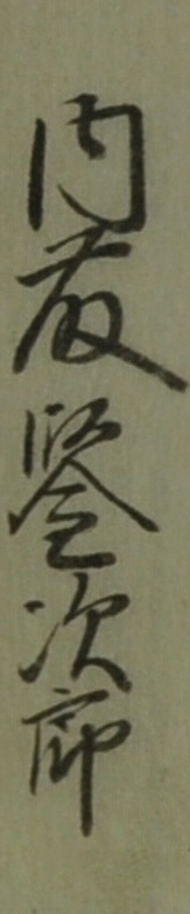内藤鑑次郎
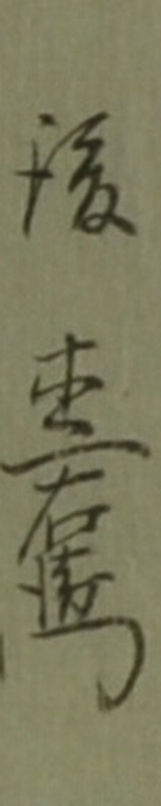後杢右衛門
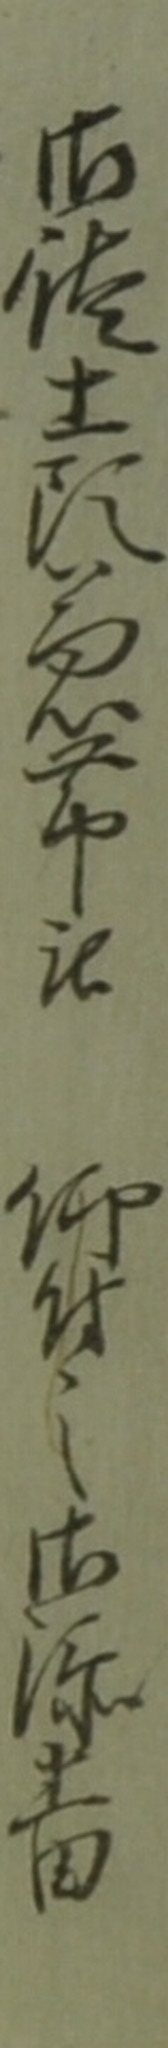御徒士頭兼帯被仰付之御添番

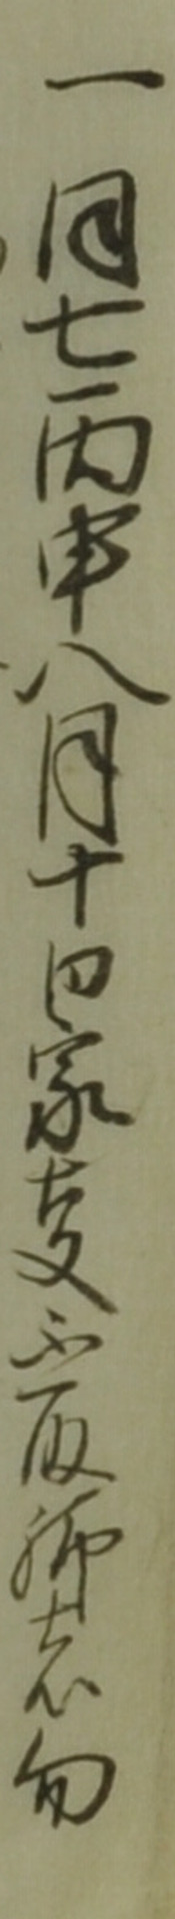一同七丙申八月十日家事不取締者勿
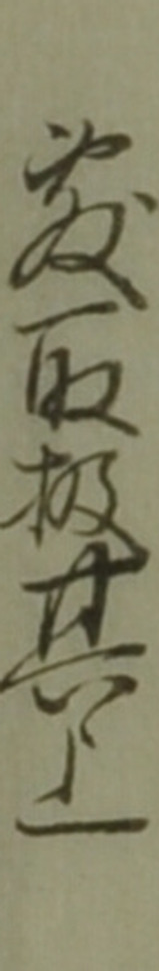敷取扱其上
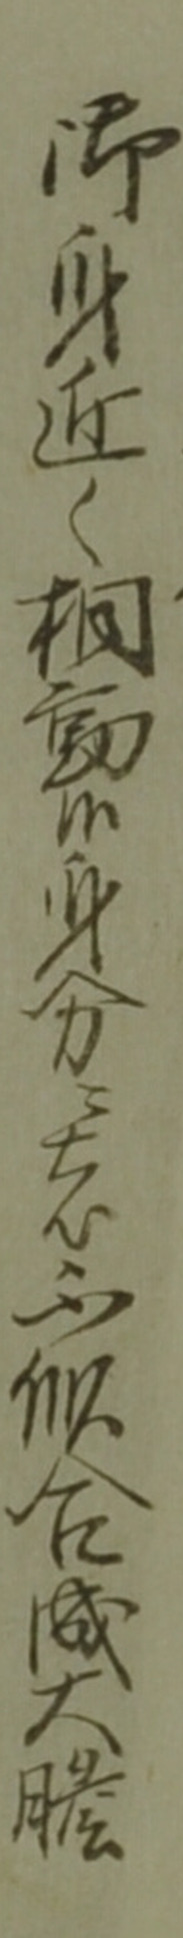御身近く相勤候身分ニ者不似合成大膽
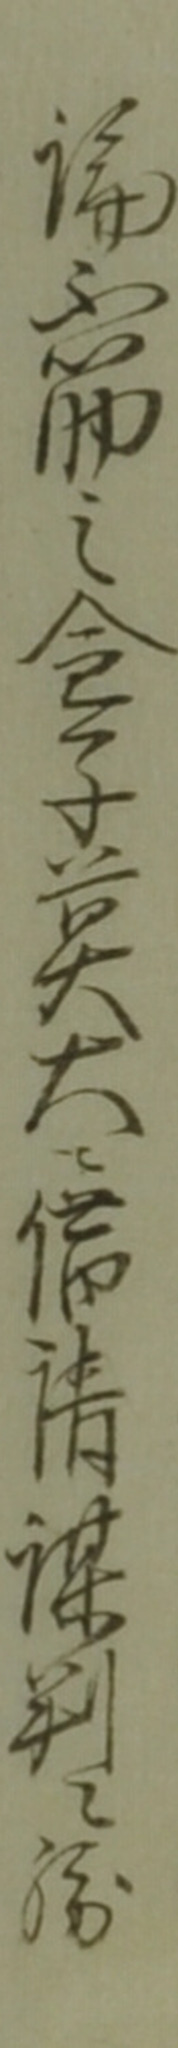論不筋之金子莫大ニ備請謀判ニ勝
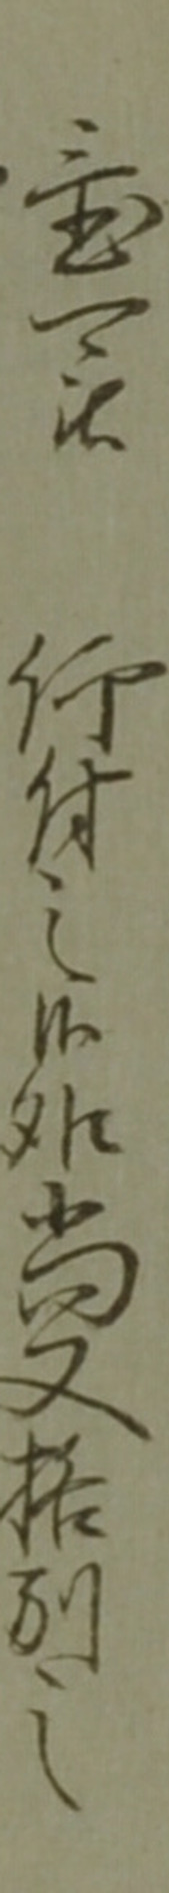置可被仰付之候処尚又格別之
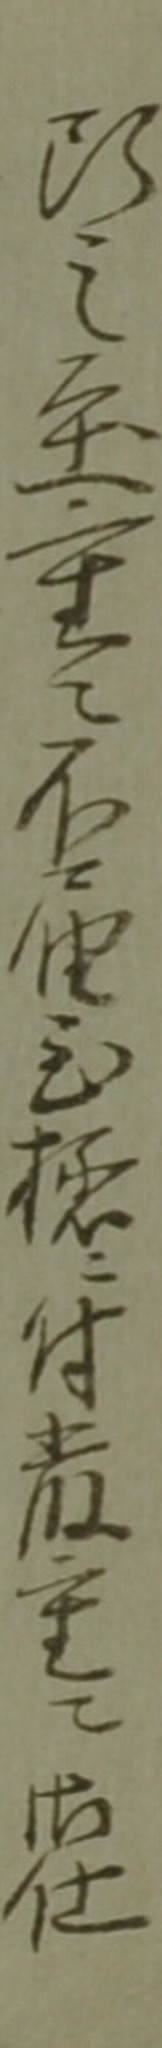断之至重々不届至極ニ付厳重ニ御仕
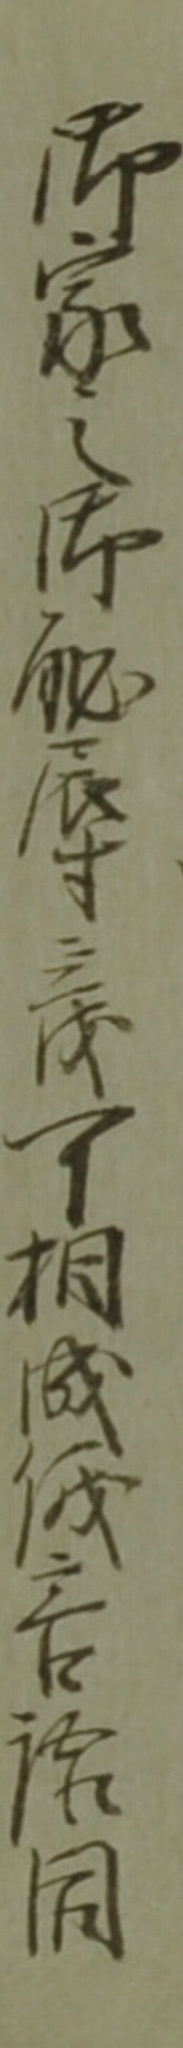御家之御恥辱ニ茂了相成俄言語道
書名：諸御役代々録（六）
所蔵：伊那市立高遠町図書館・合同会社AMANE
